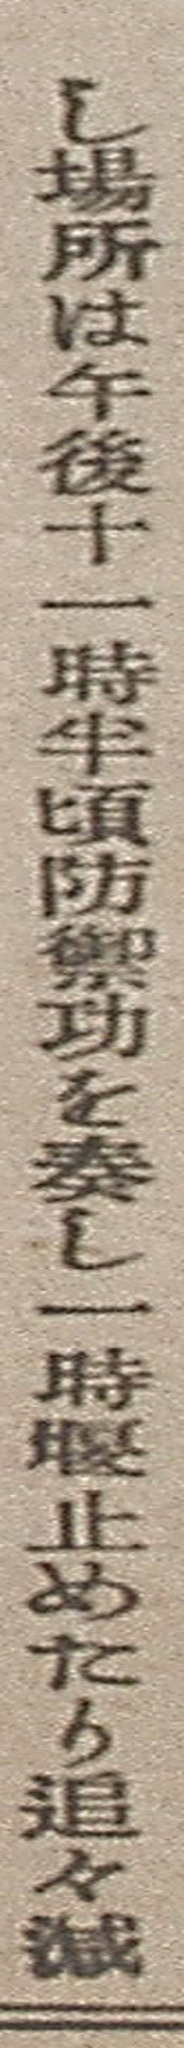し場所は午後十一時半頃防禦功を奏し一時堰止めたり追々減
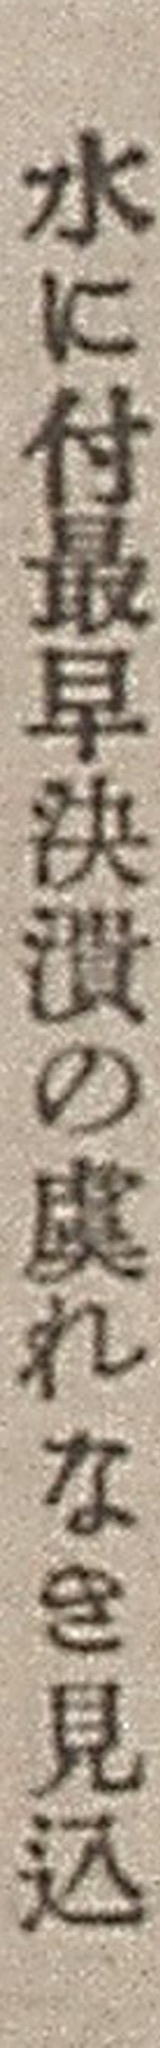水に付最早決壊の虞れなき見込
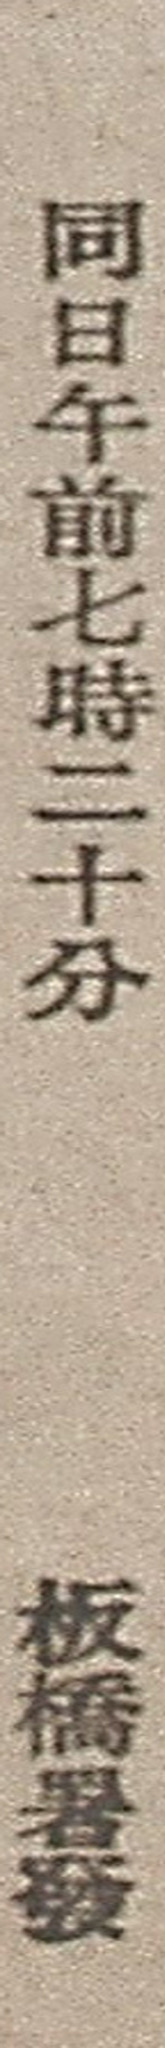同日午前七時二十分板橋署発
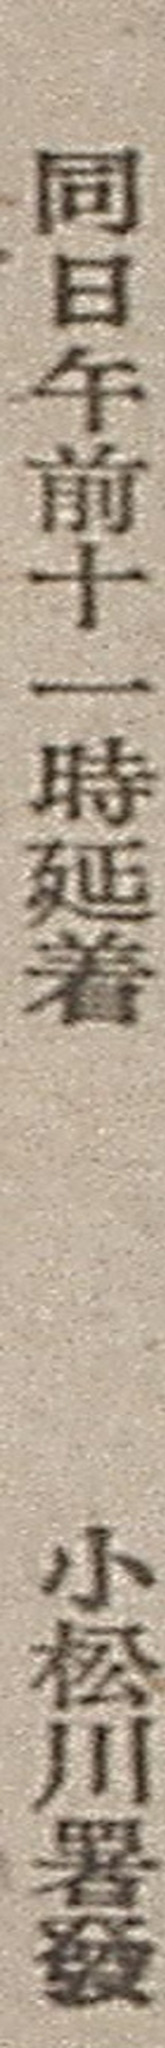同日午前十一時延着小松川署発
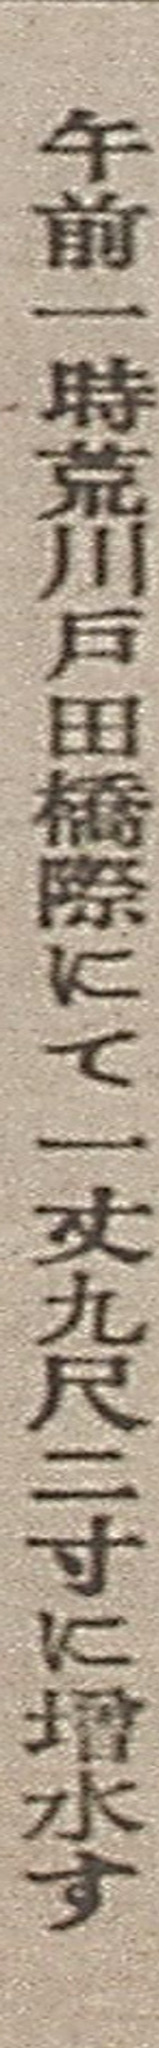午前一時荒川戸田橋際にて一丈九尺二寸に増水す
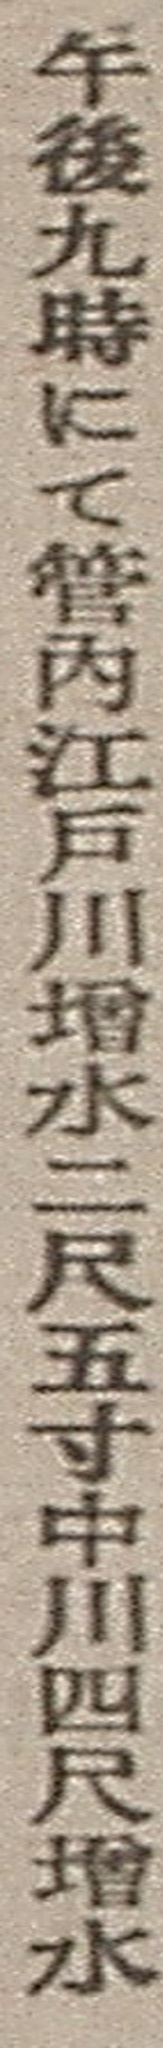午後九時にて管内江戸川増水二尺五寸中川四尺増水
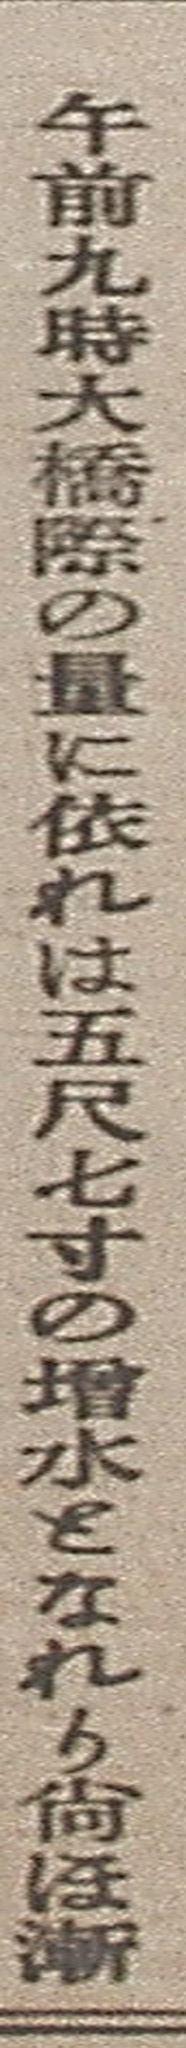午前九時大橋際の量に依れは五尺七寸の増水となれり尚ほ漸
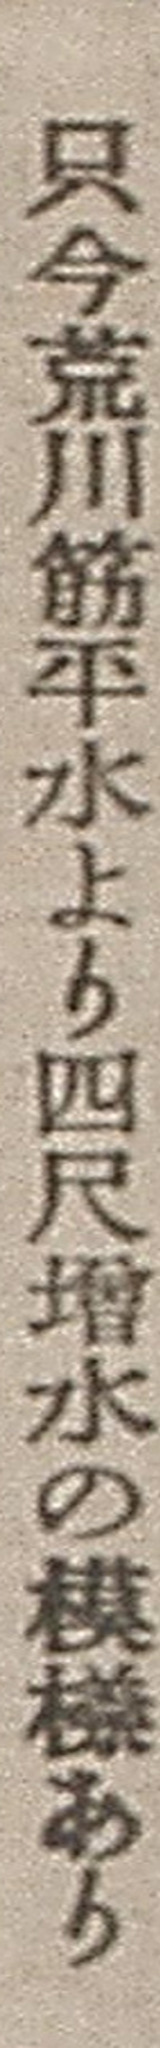只今荒川筋平水より四尺増水の模様あり
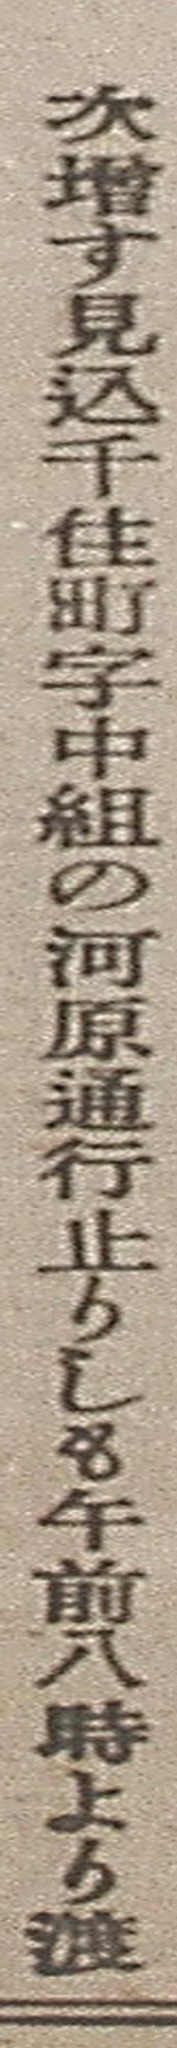次増す見込千住町字中組の河原通行止りしも午前八時より渡
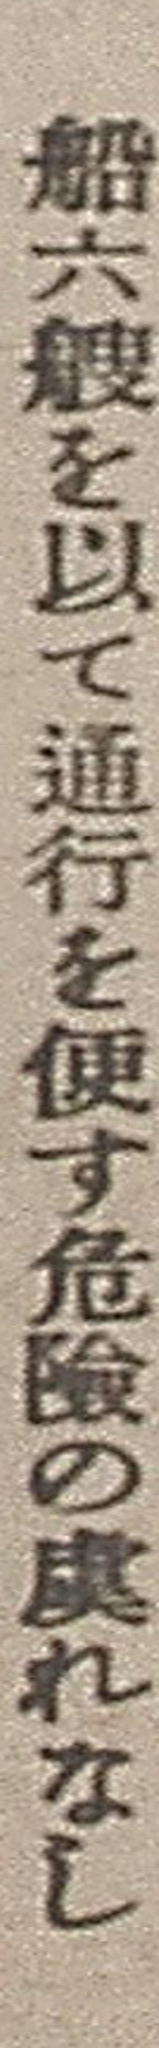船六艘を以て通行を便す危険の虞れなし
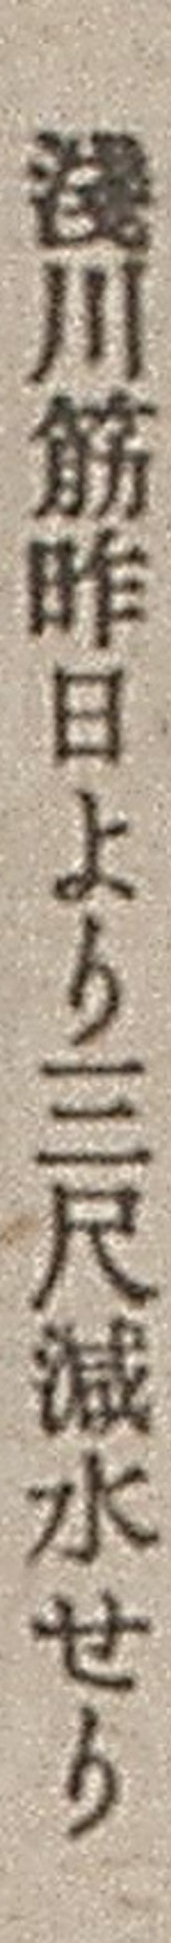浅川筋昨日より三尺減水せり
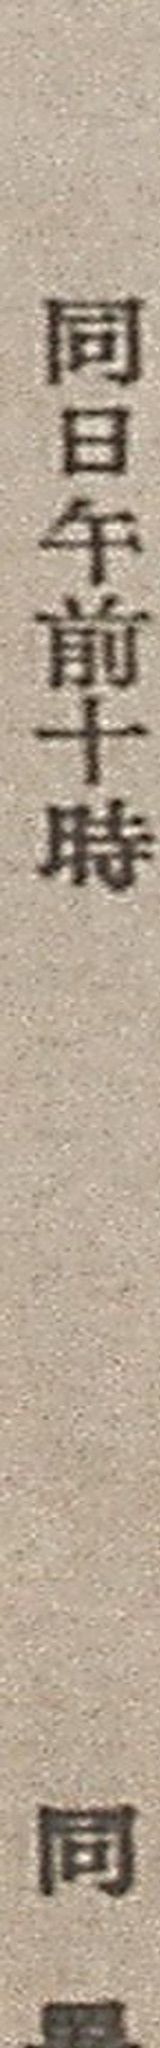同日午前十時同署発
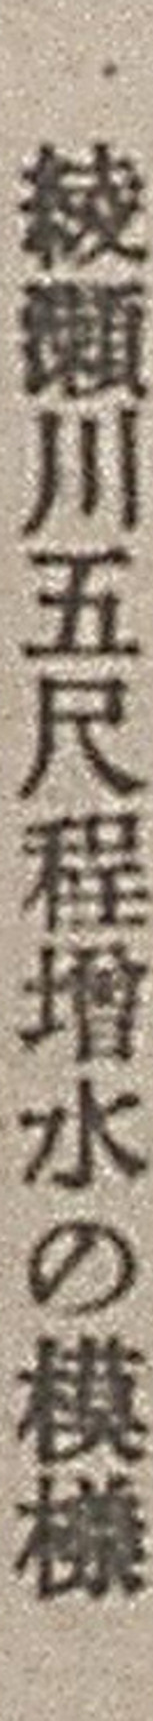綾瀬川五尺程増水の模様
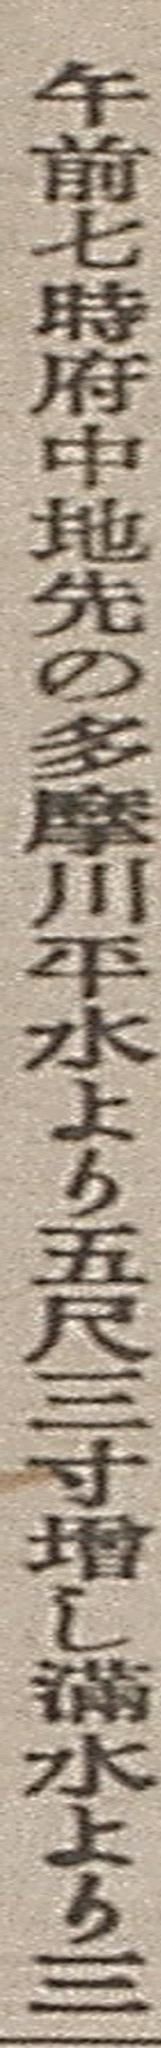午前七時府中地先の多摩川平水より五尺三寸増し満水より三
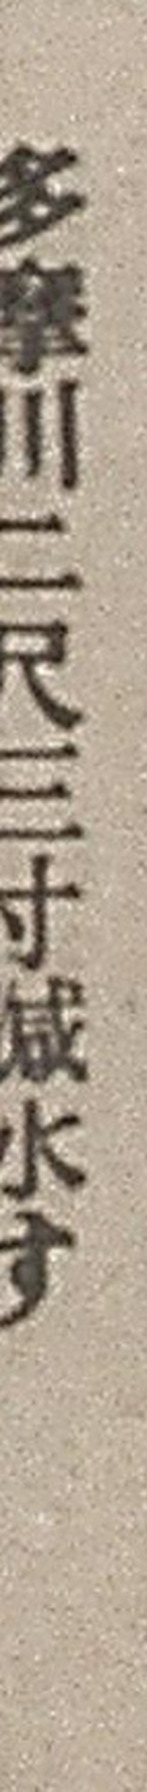多摩川二尺三寸減水す
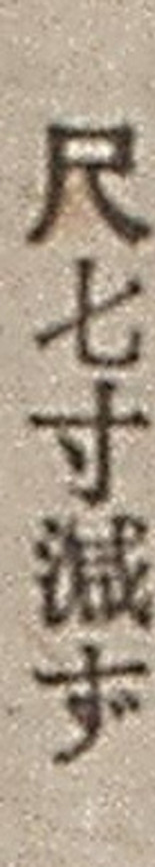尺七寸減ず
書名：風俗畫報臨時増刊第百九十九號　明治三十二年十月各地災害圖會（前編之續）
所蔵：東京大学地震研究所図書室 Earthquake Research Institute Library, The University of Tokyo, JAPAN
